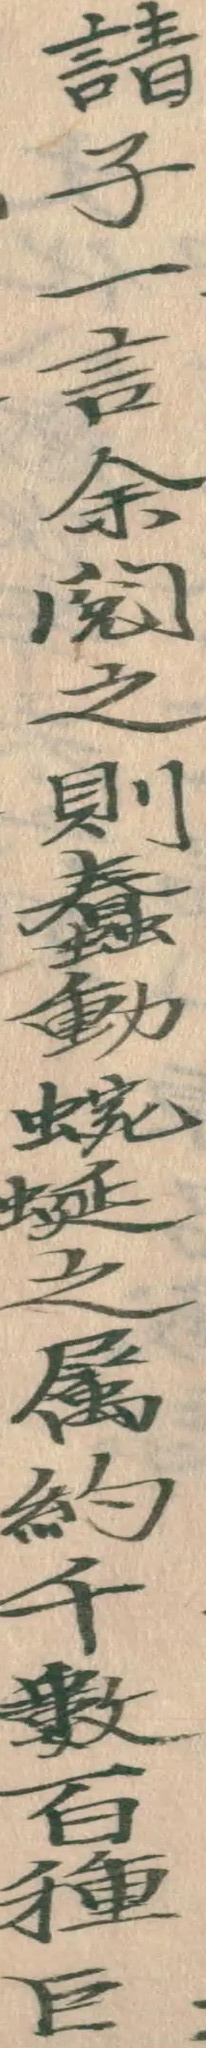請子一言余閲之則蠢動蜿蜒之属約千数百種巨
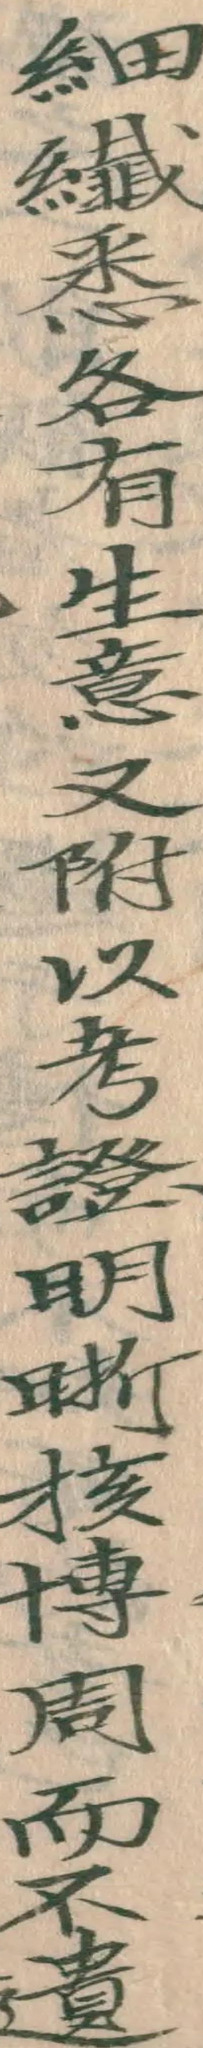細繊悉各有生意又附以考証明晰核博周而不遺
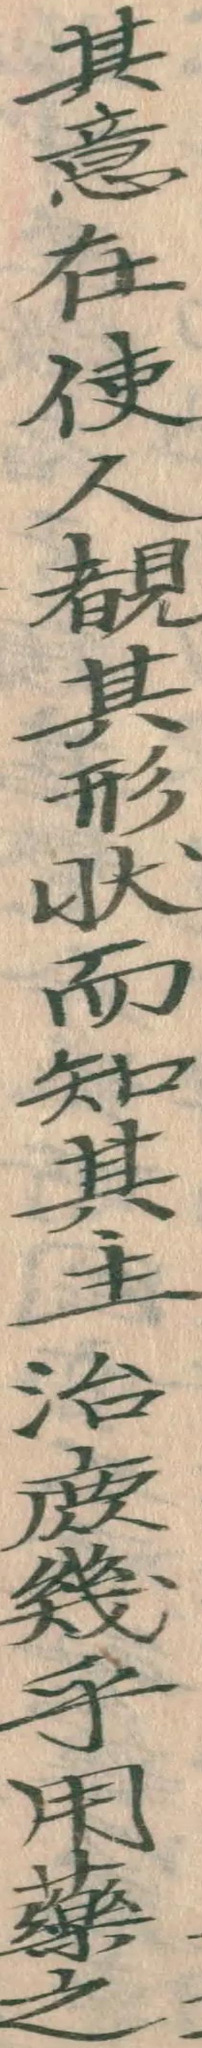其意在使人覩其形状而知其主治庶幾乎用薬之
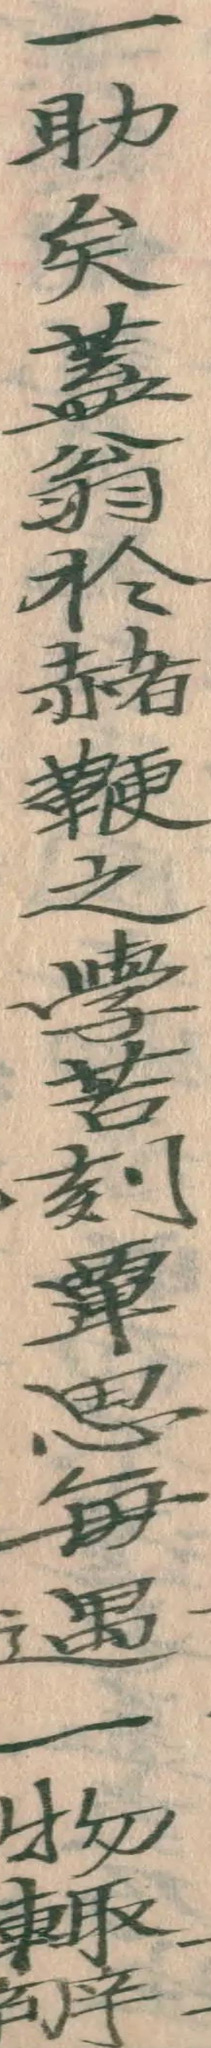一助矣蓋翁於赭鞭之学苦刻覃思毎遇一物輙辨
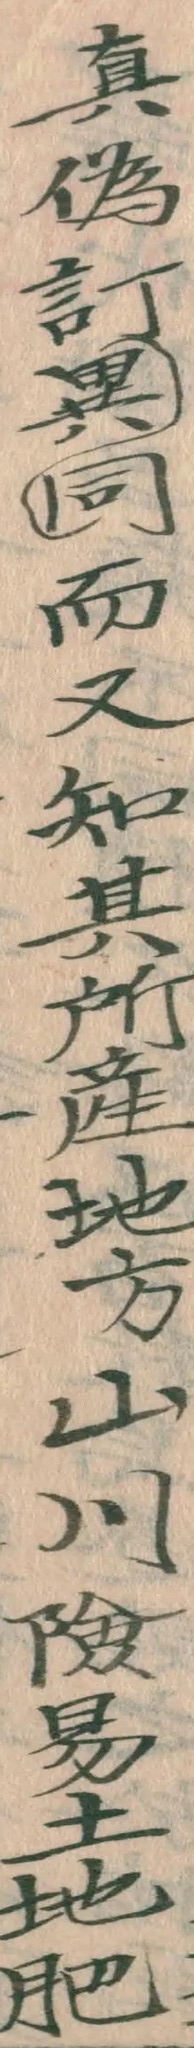真偽訂異同而又知其所産地方山川険易土地肥
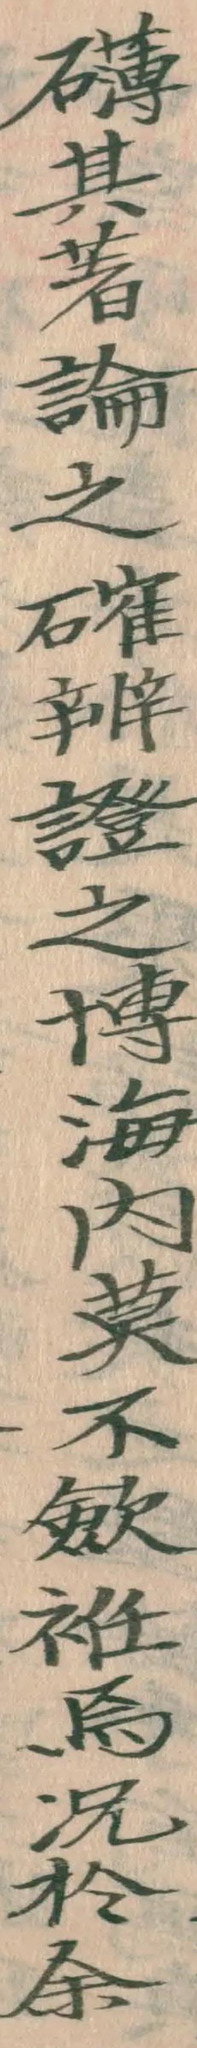礴其著論之確辨証之博海内莫不斂袵焉況於余
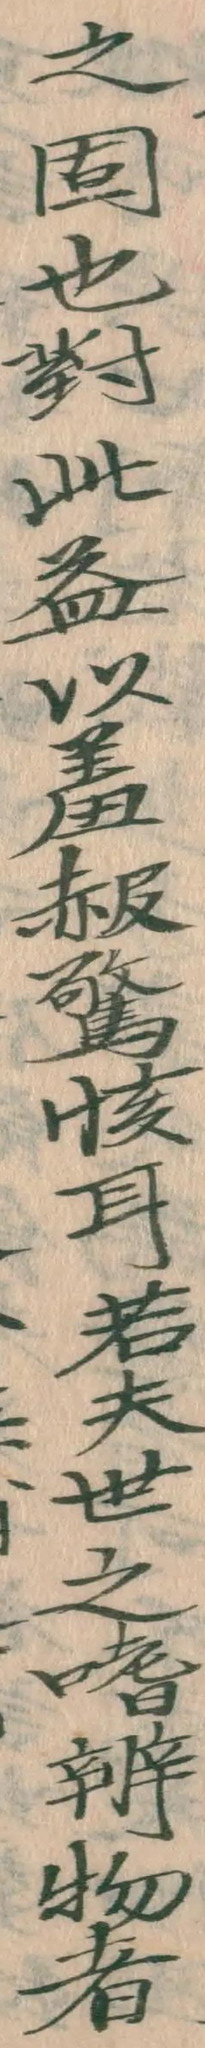之固也対此益以羞赧驚㤥耳若夫世之嗜辨物者
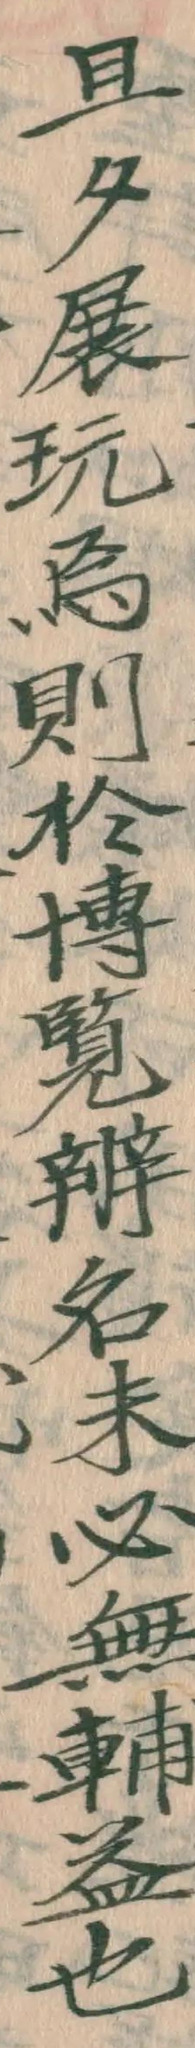旦夕展玩焉則於博覧辨名未必無輔益也
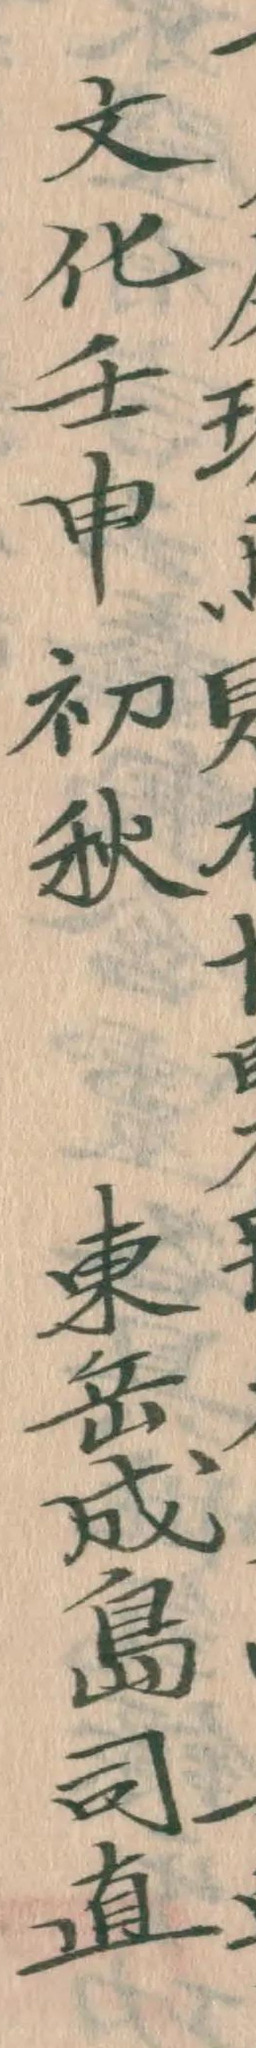文化壬申初秋東岳成島司直
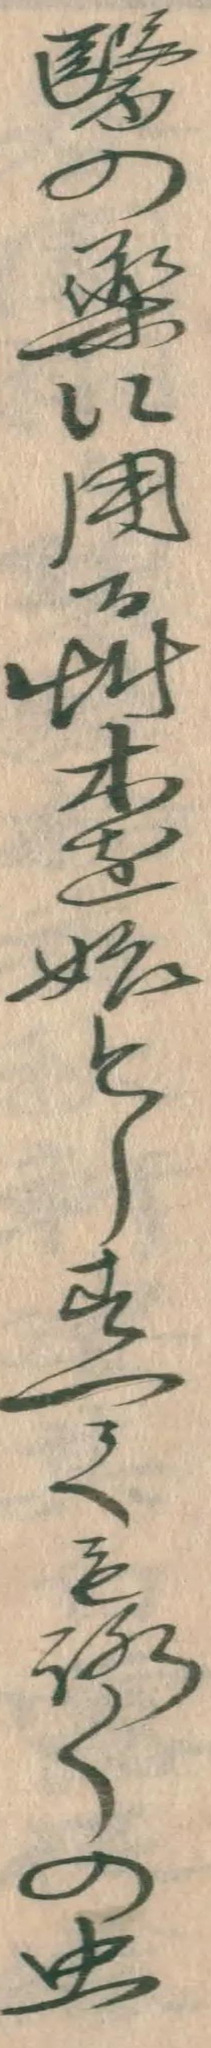醫の薬に用る草木を始としすへてもろ〳〵の虫
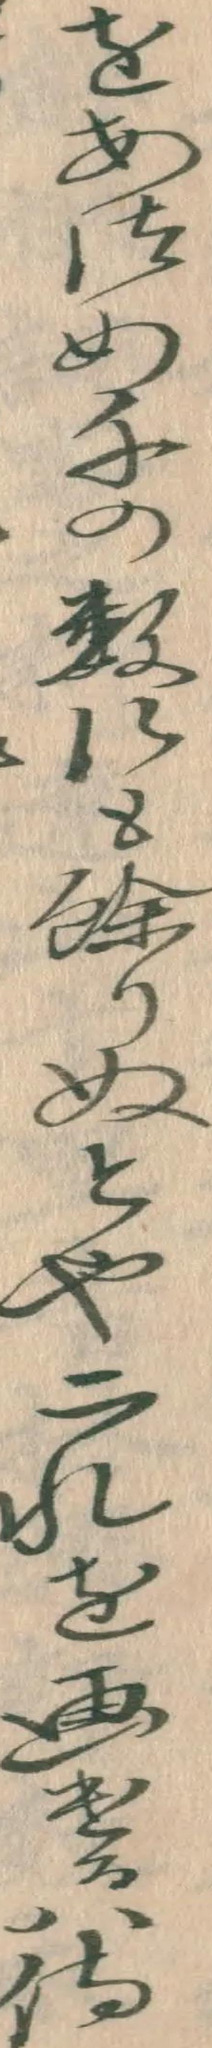をあつめ千の数にも余りぬとやこれを画けるは侍
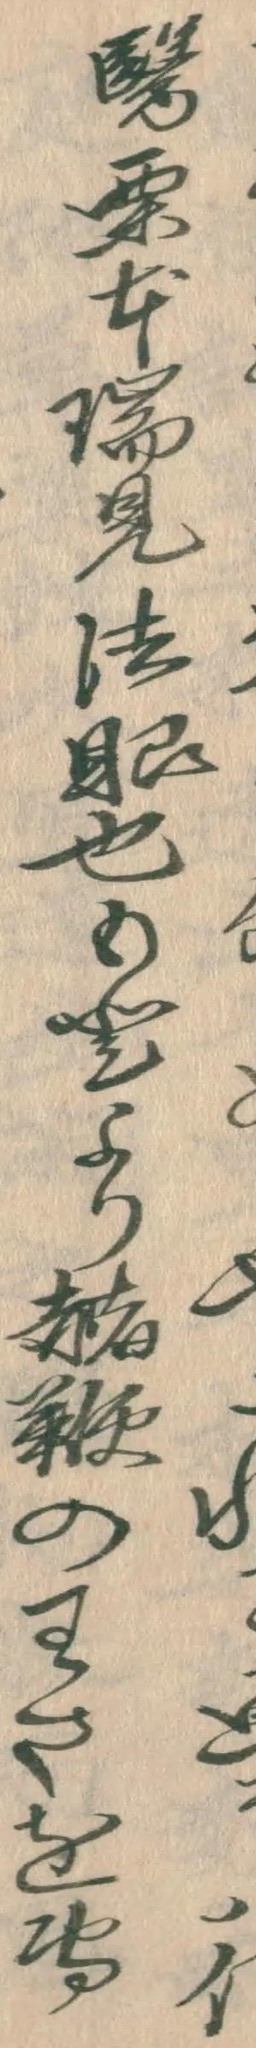醫栗本瑞見法眼也もとより赭鞭のわさを専
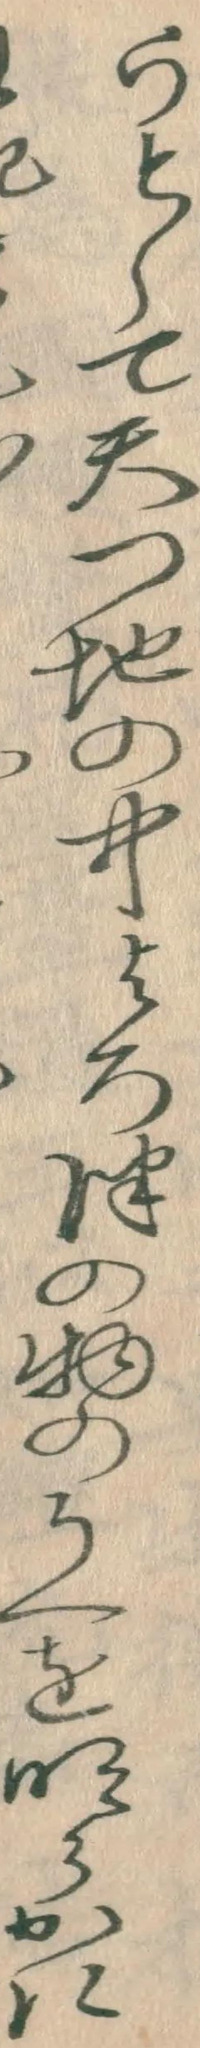らとして天つ地の中よろつの物のうへを明らかに
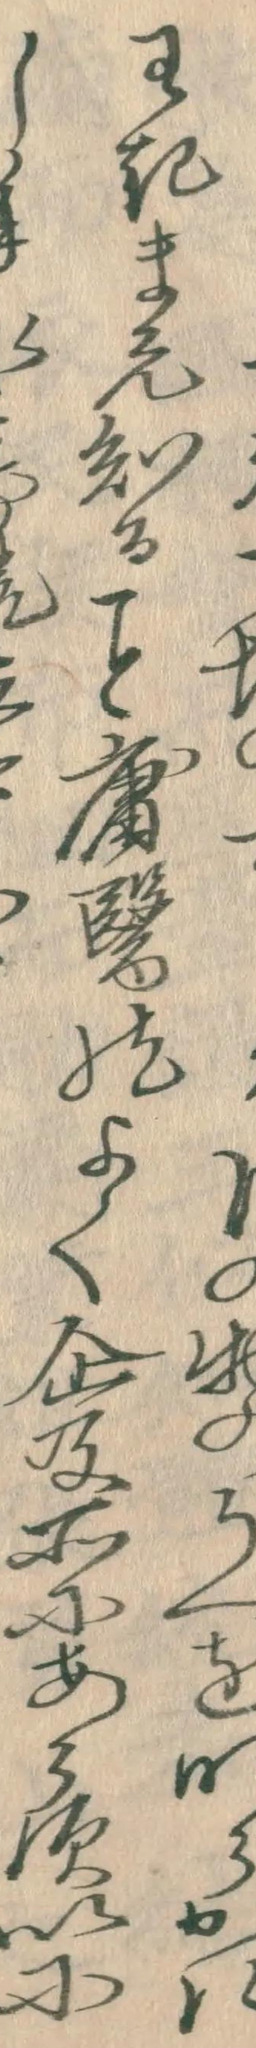わきまえ知ること庸醫のよく企及所にあらすいに
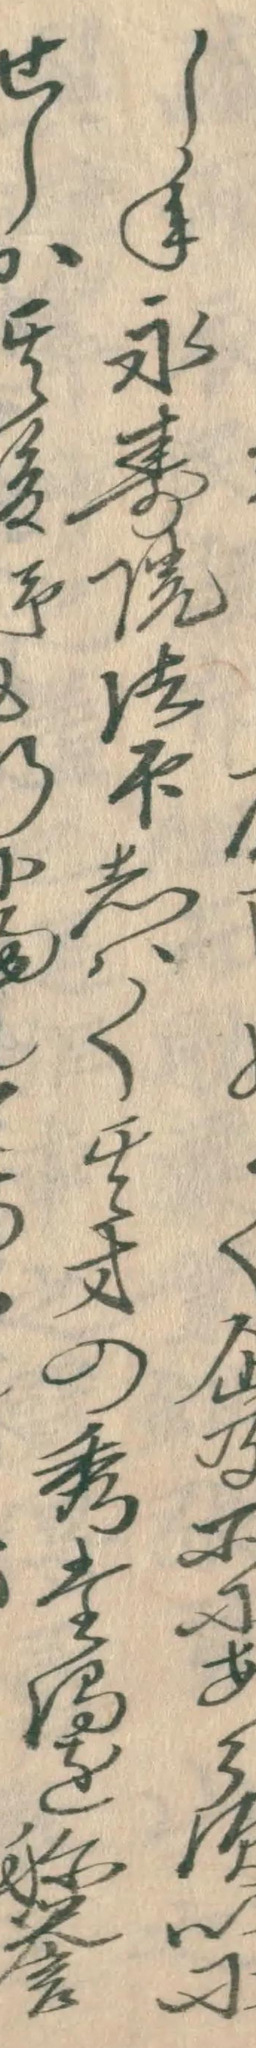し年永寿院法印しは〳〵其才の秀たるを称誉
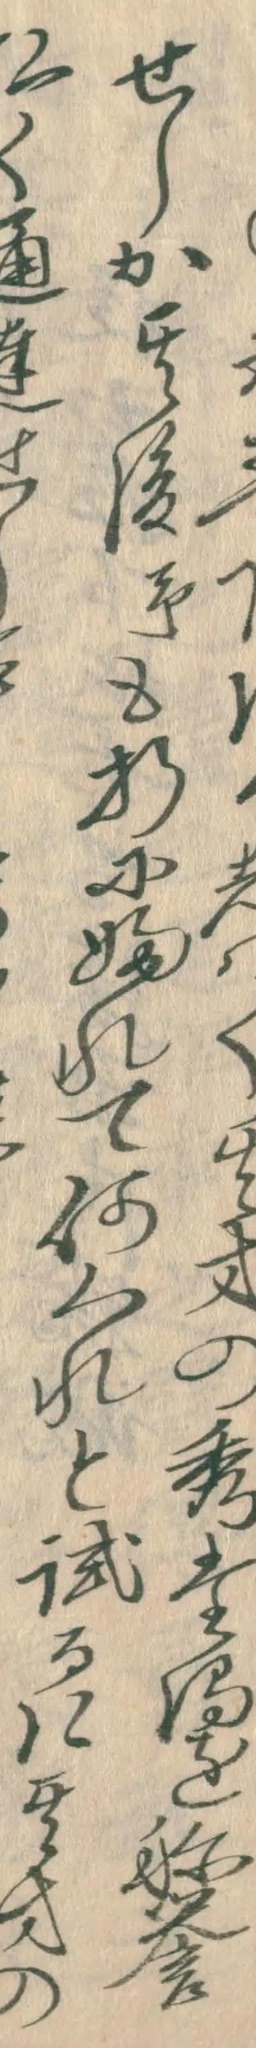せしか其後予も折にふれて何くれと試るに其才の
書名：千蟲譜 3巻. [1]
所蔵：国立国会図書館 National Diet Library, JAPAN
